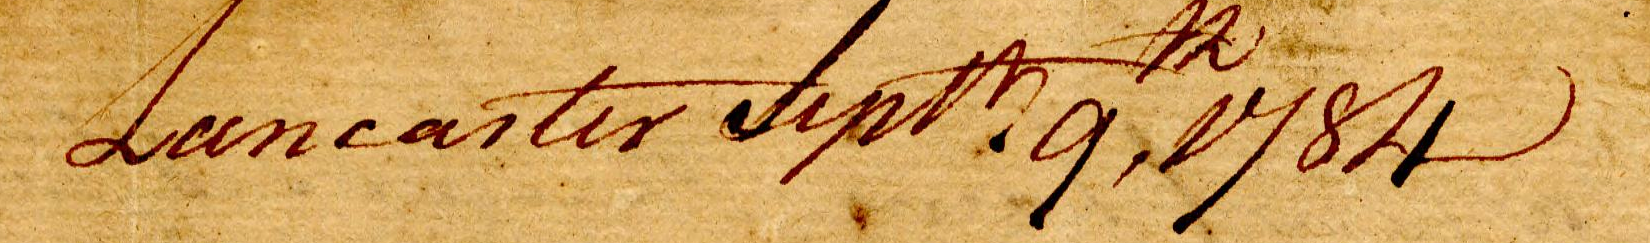Lancaster Sept^r. 9^th 1784
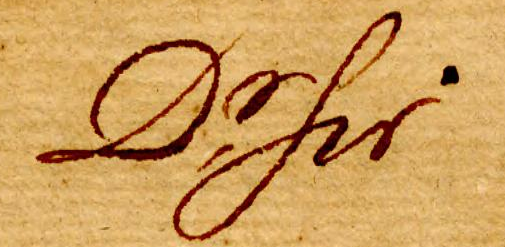D^r. sir
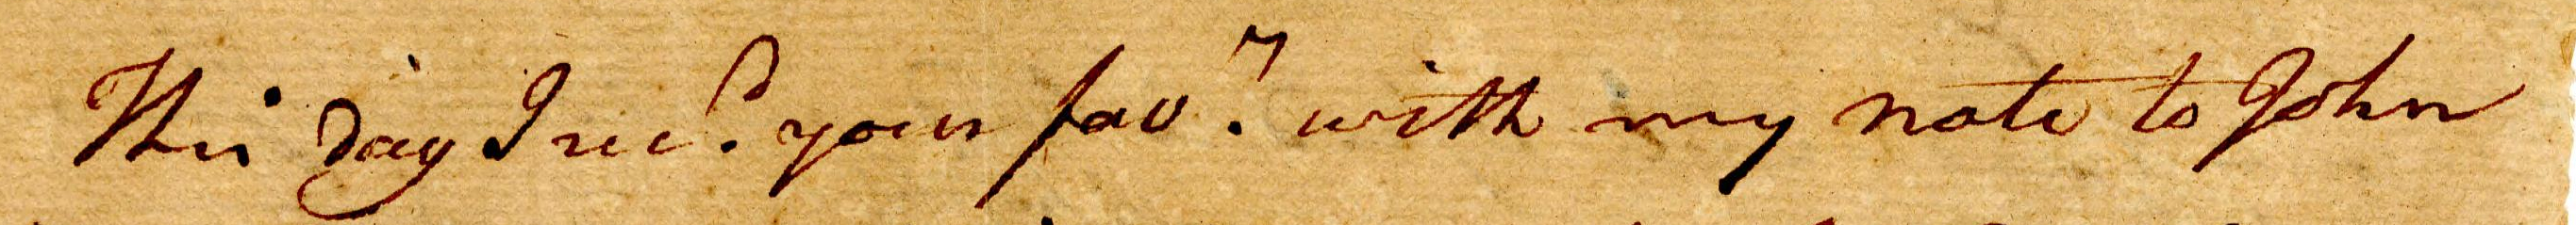This day I rec^d. your fav^r. with my note to John
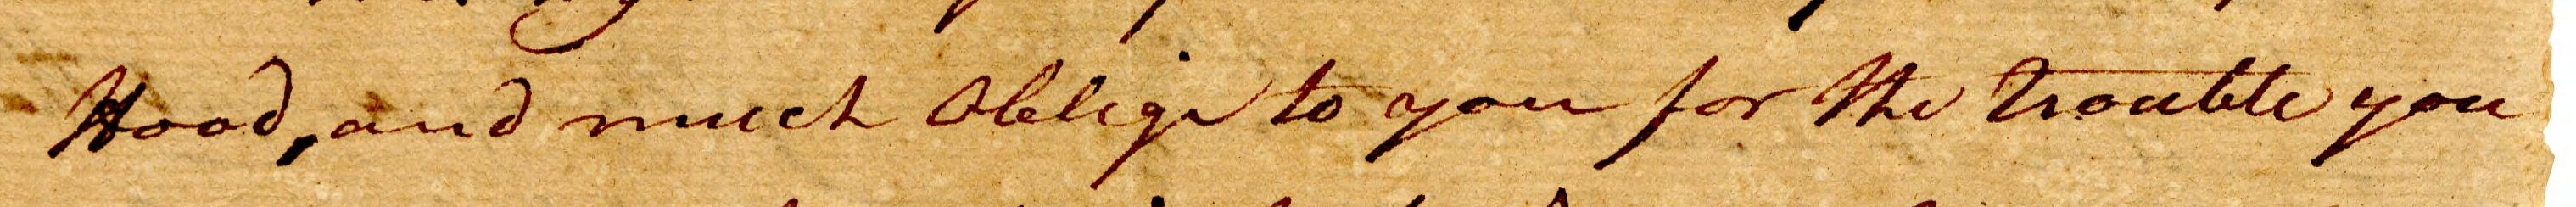Hood, and much Oblige to you for the trouble you
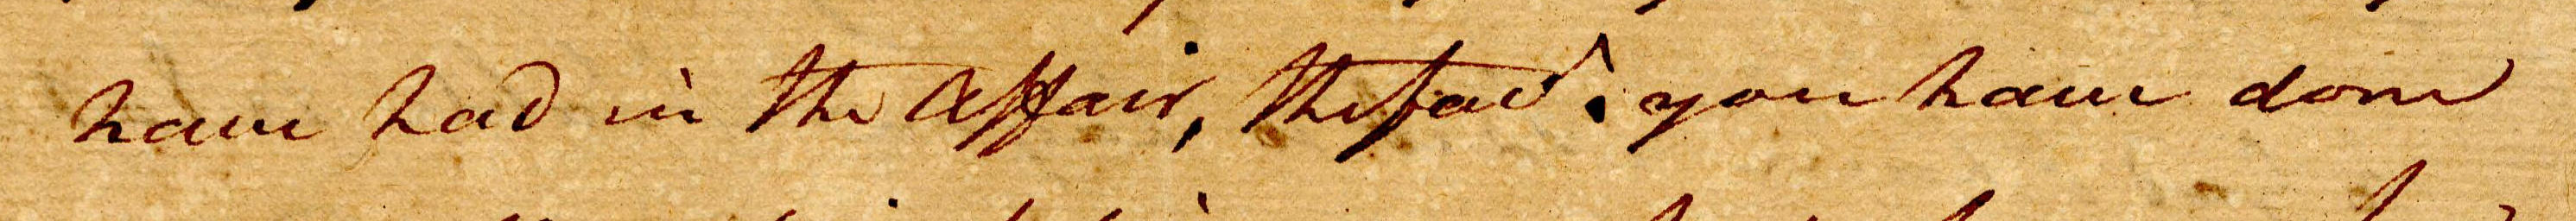have had in the Affair, the fav^r you have done
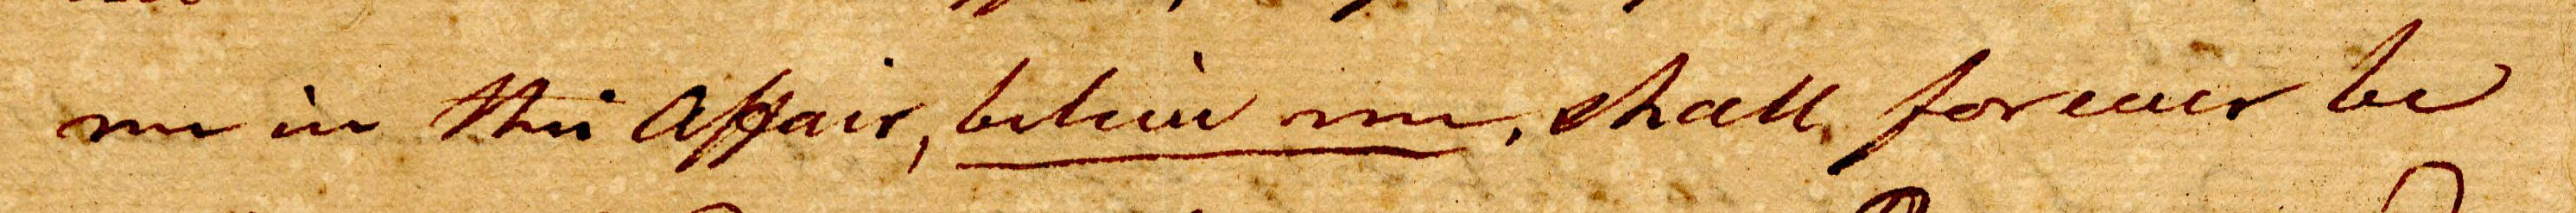me in this Affair, believe me, shall forever be
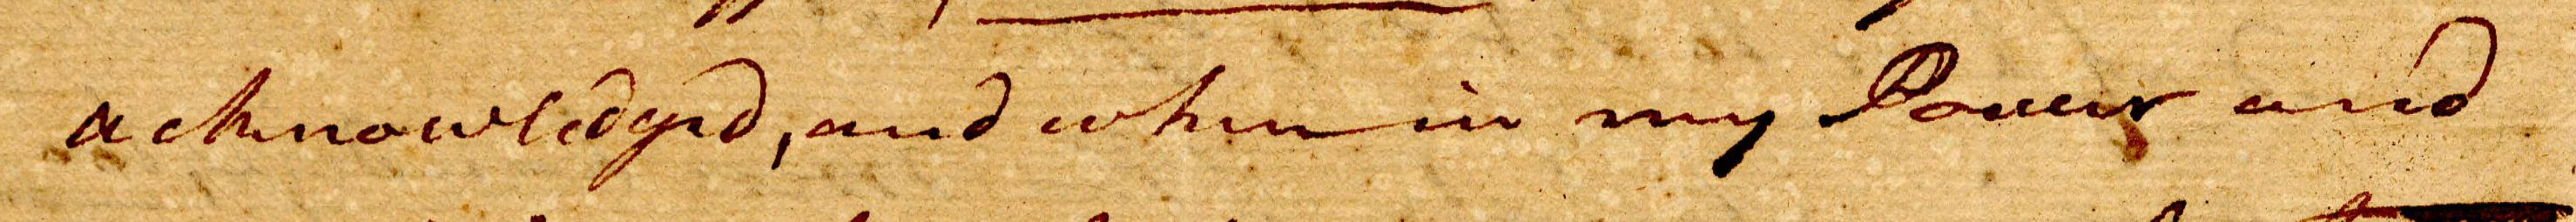acknowledged, and when in my Power and
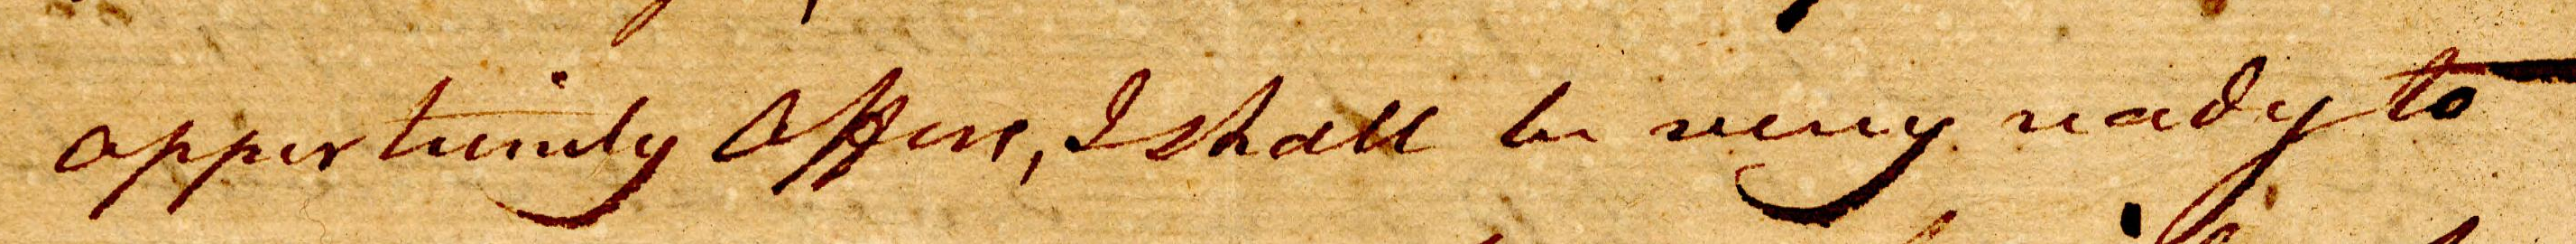opportunity offers, I shall be very ready to
